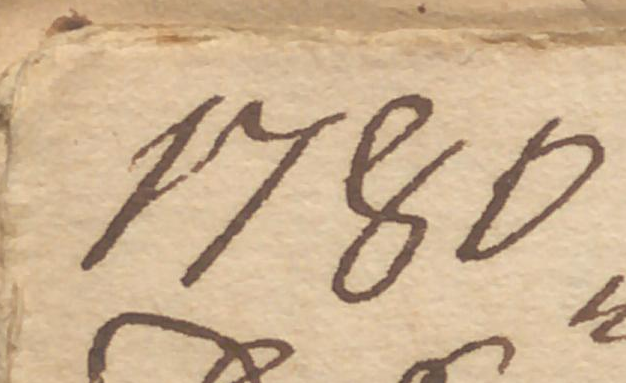1780
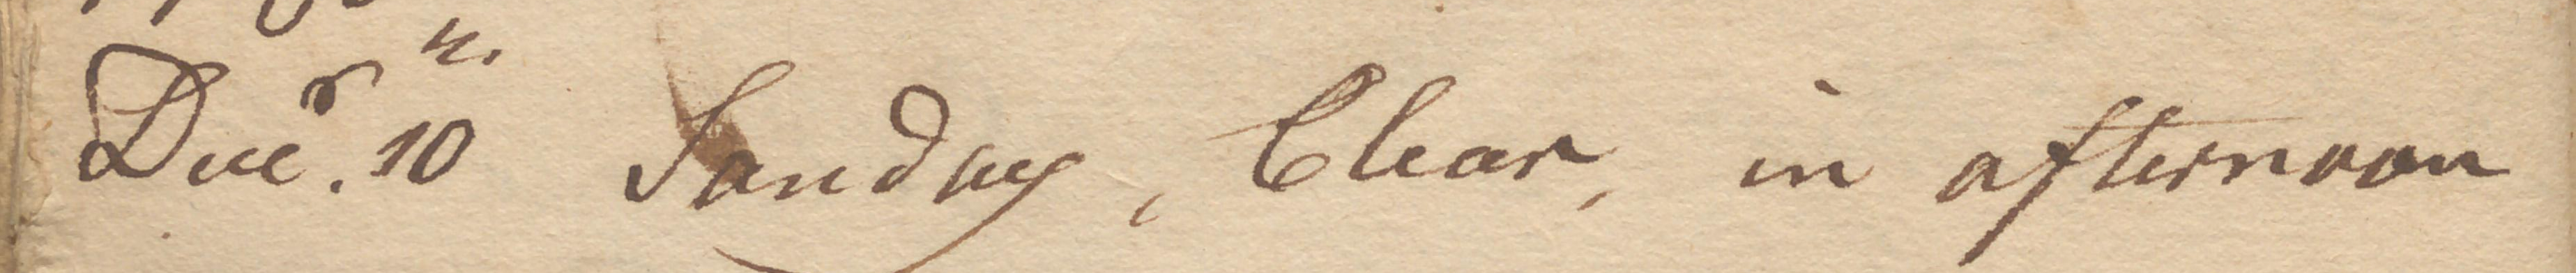Dece^r. 10^th Sunday Clear in afternoon
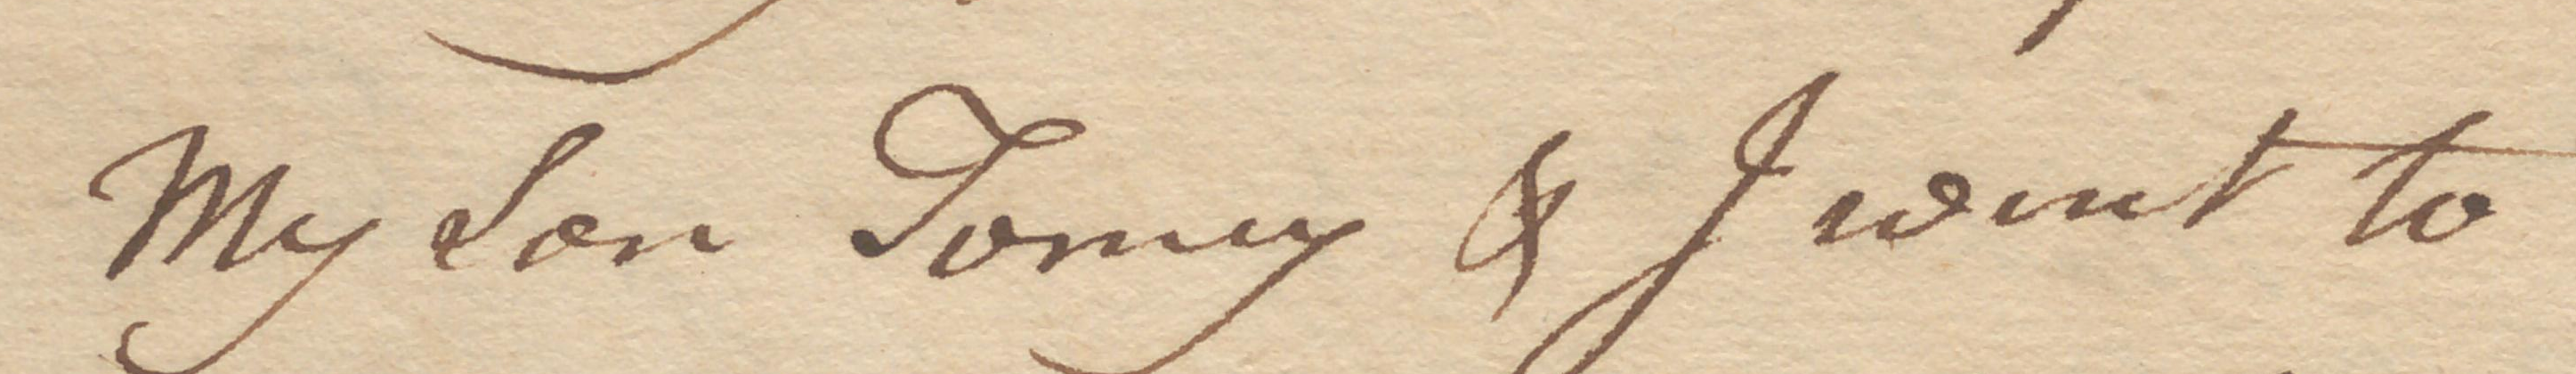My Son Tomey & I went to
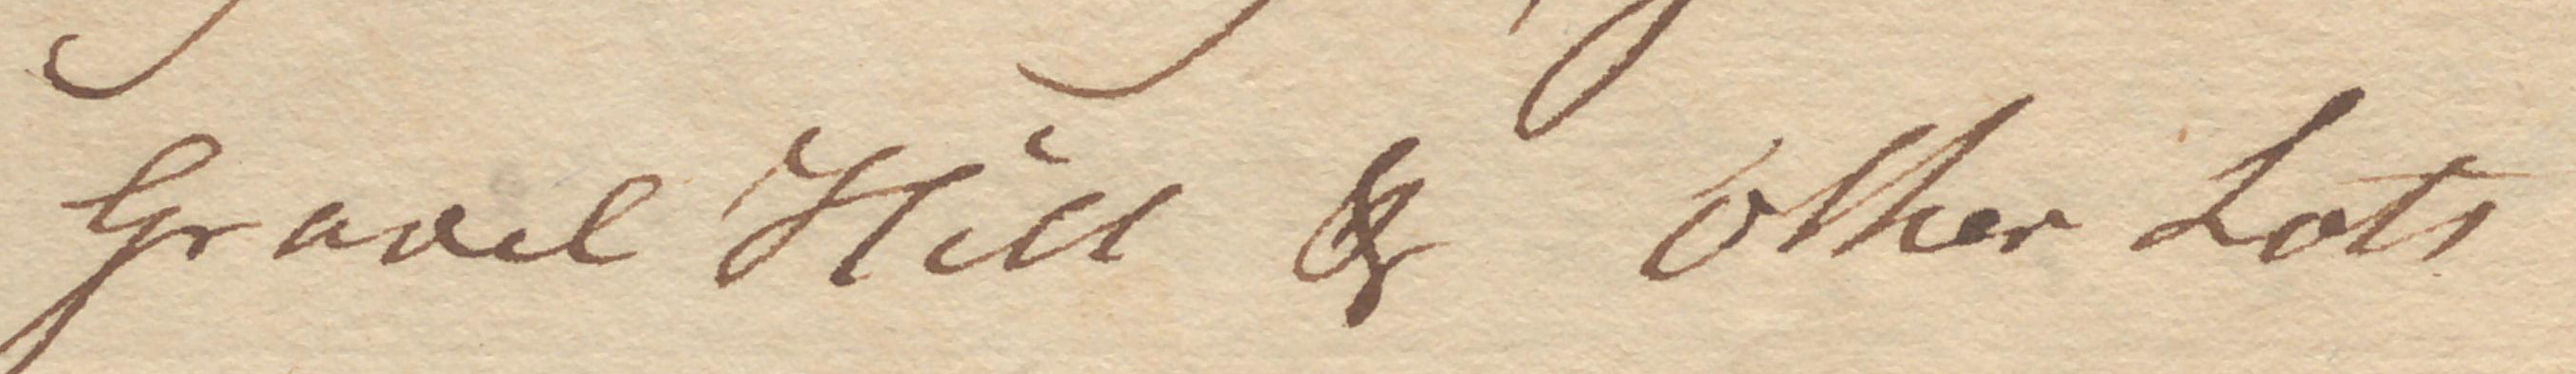Gravel Hill & other Lots
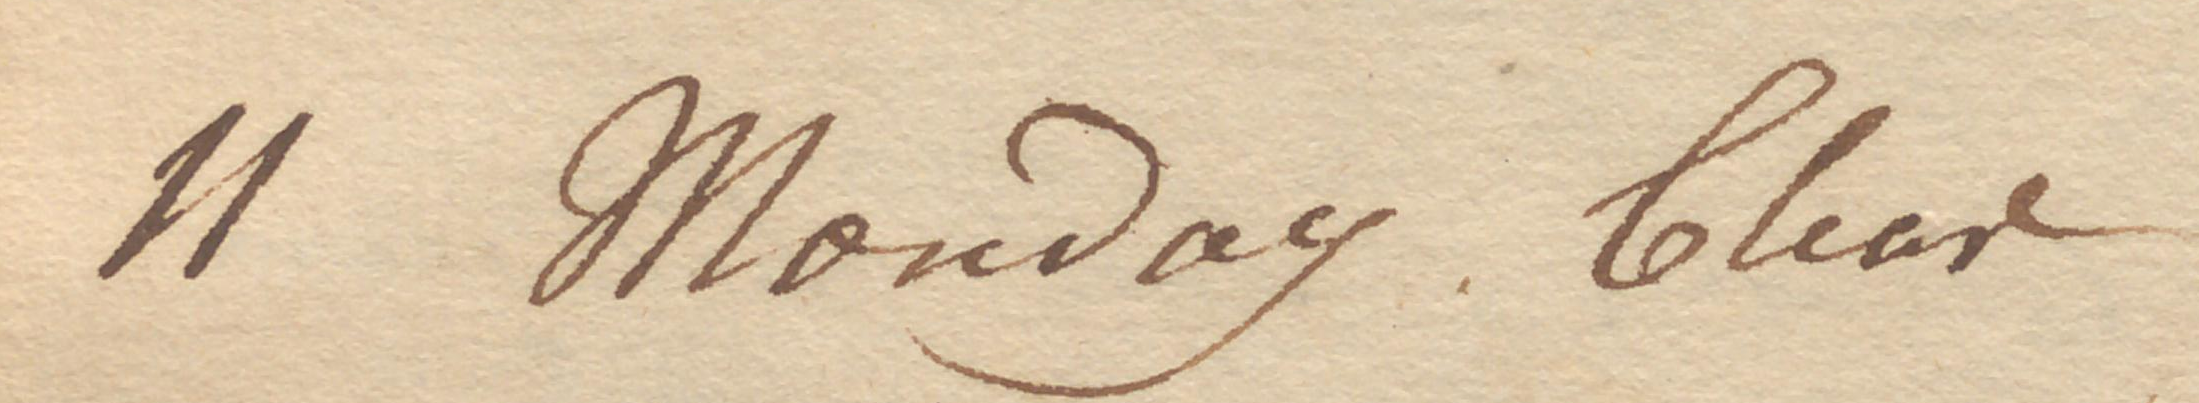11 Monday Clear
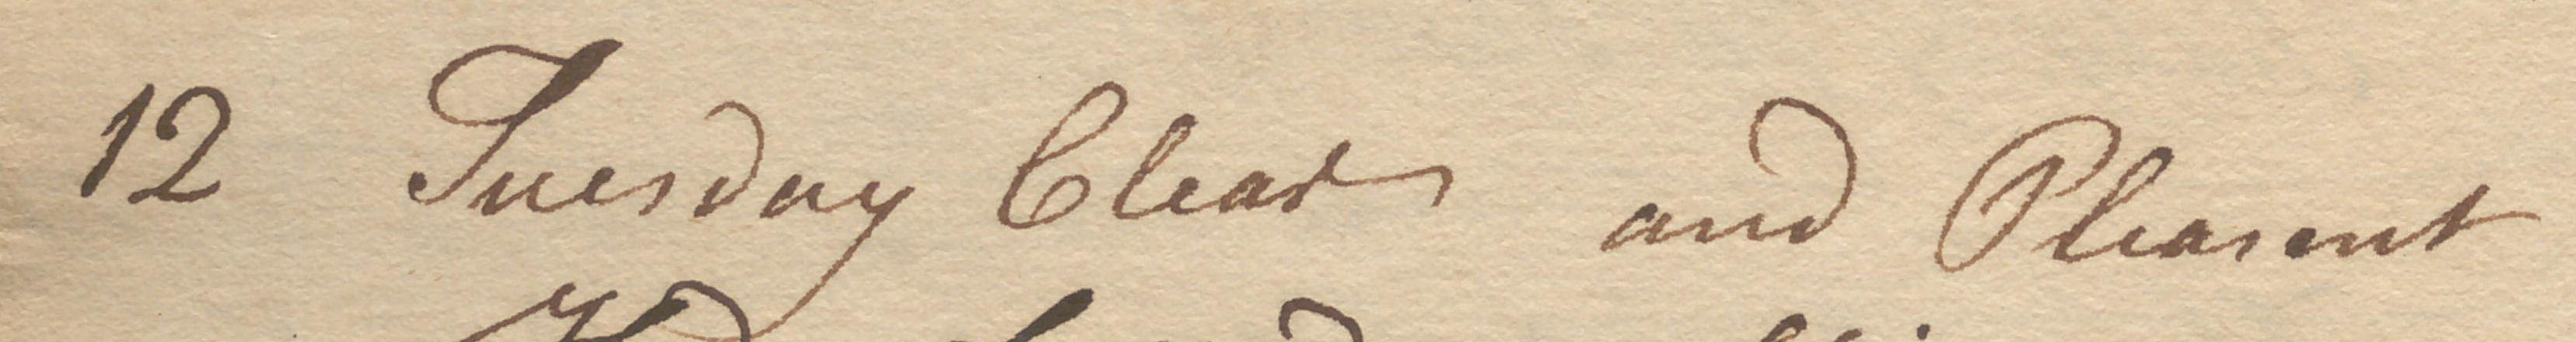12 Tuesday Clear, and Pleasent
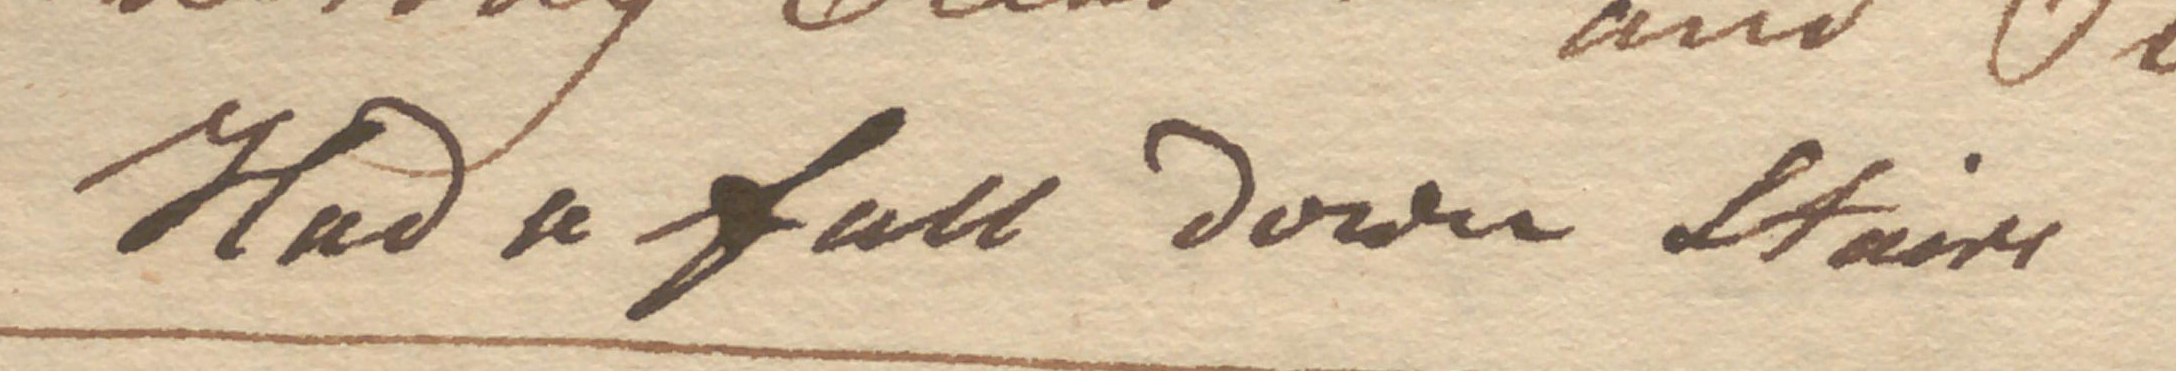Had a fall down Stairs
